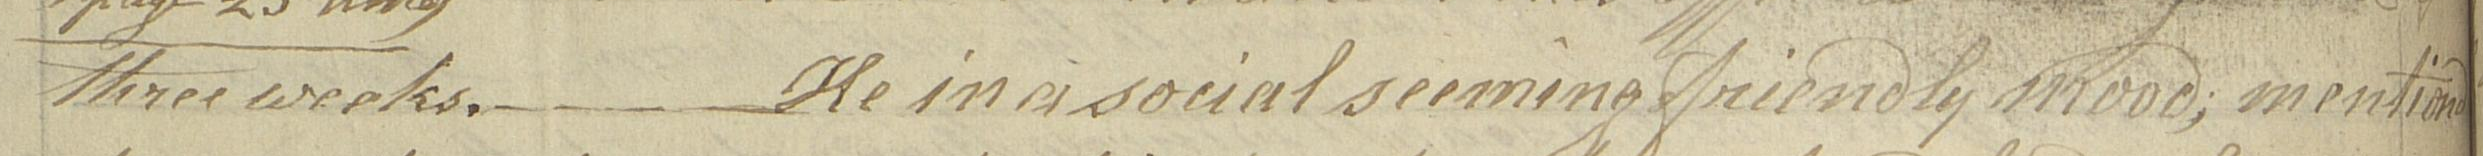Three weeks. He in a social seeming friendly mood; mention
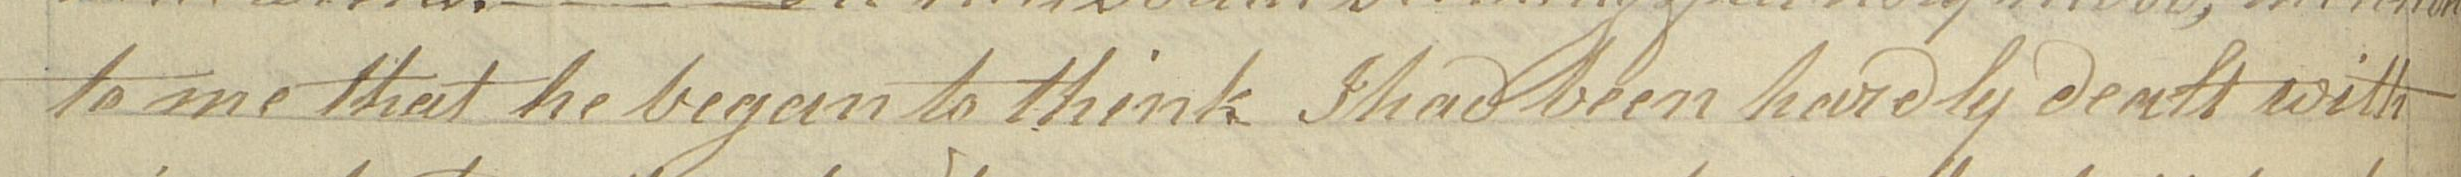to me that he began to think I had been hardly dealt with
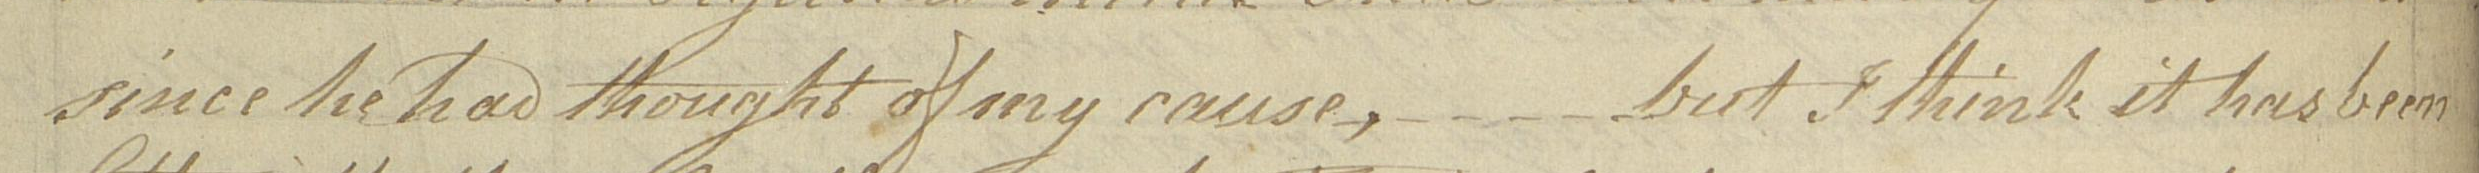since he had thought of my cause, but I think it has been
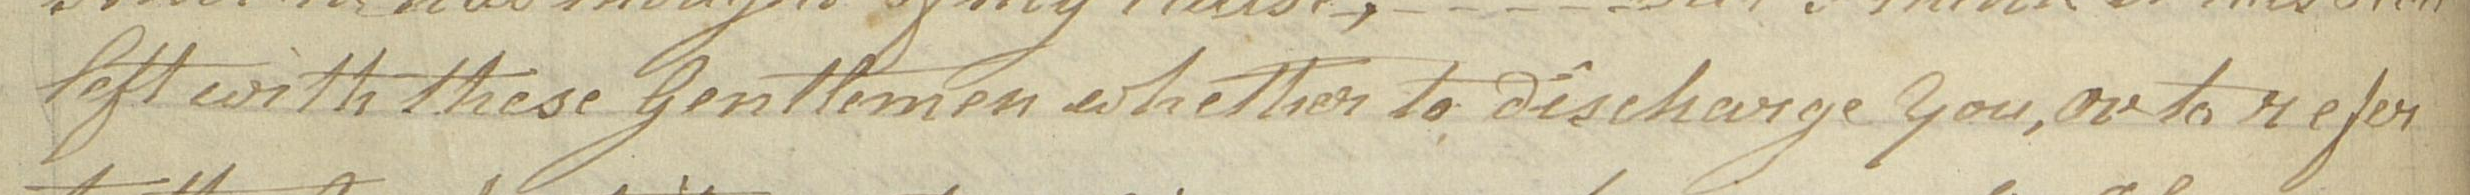left with these Gentlemen whether to discharge you, or to refer
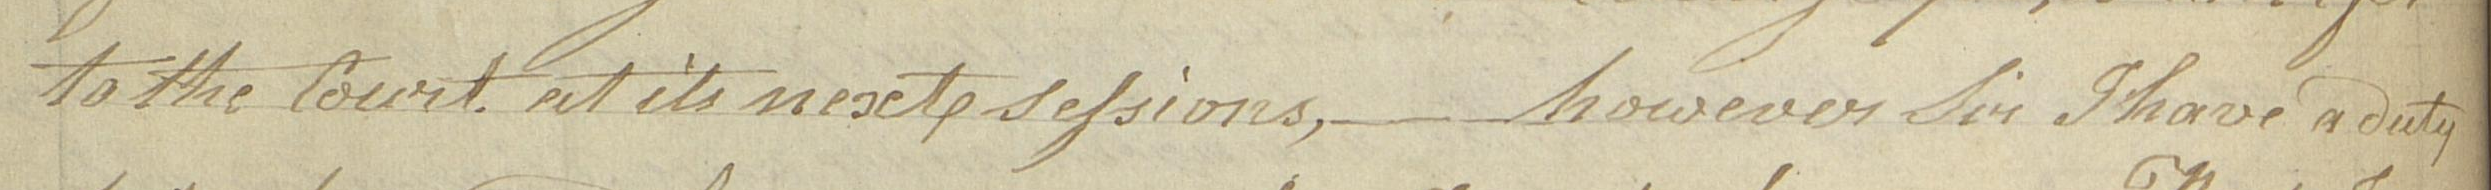to the Court at its next sessions, however Sir I have a duty
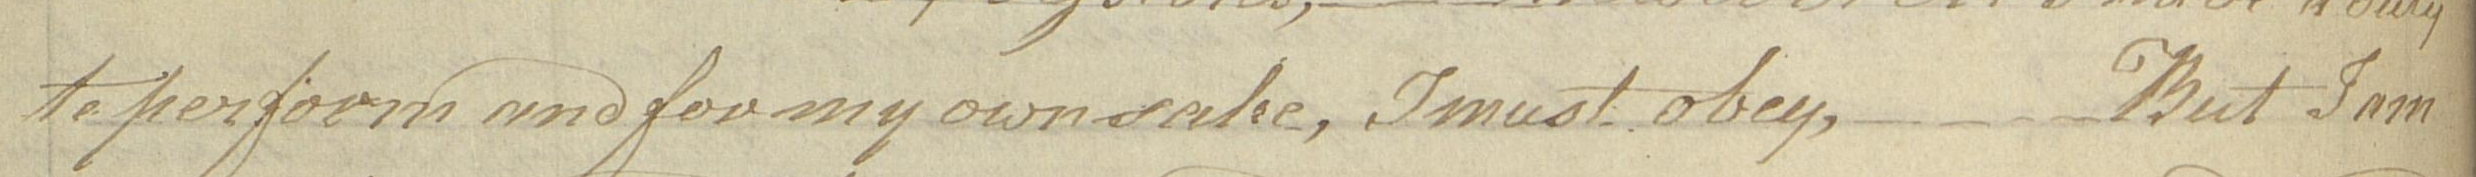to perform and for my own sake, I must obey. But I am
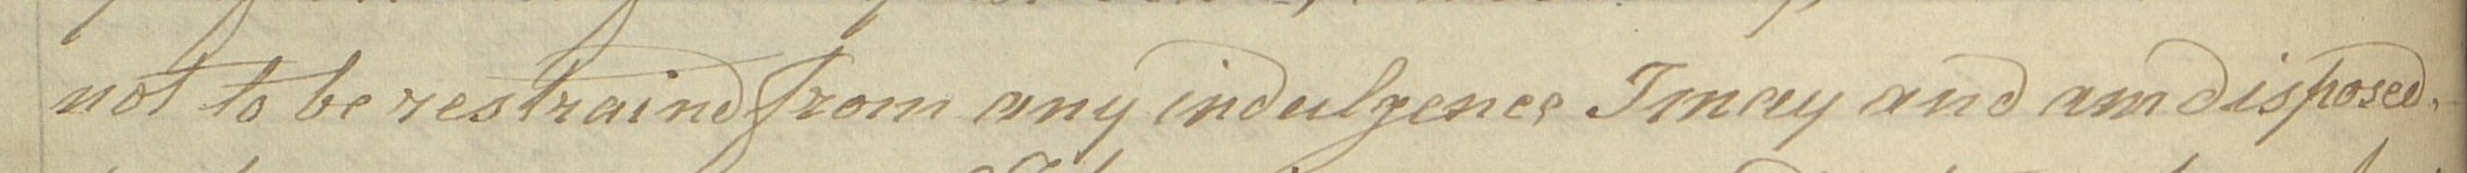not to be restrained from any indulgence I may and am disposed
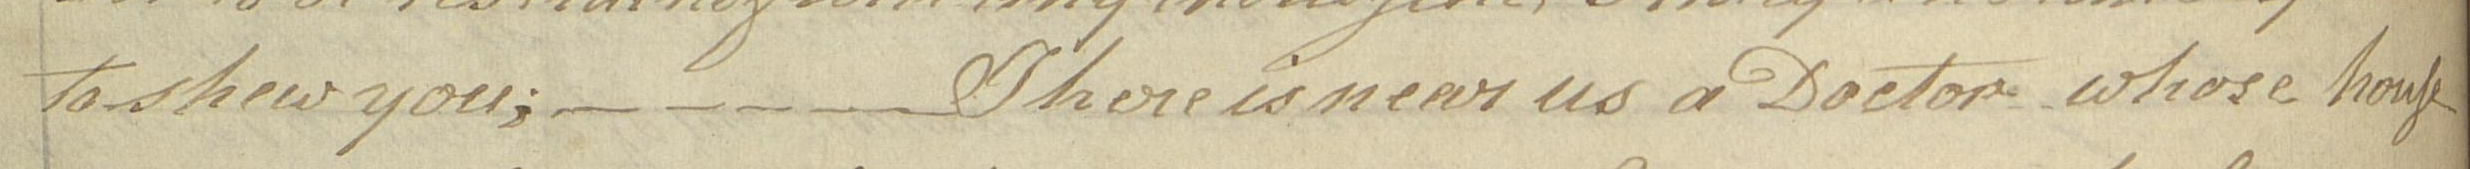to shew you; There is near us a Doctor whose house
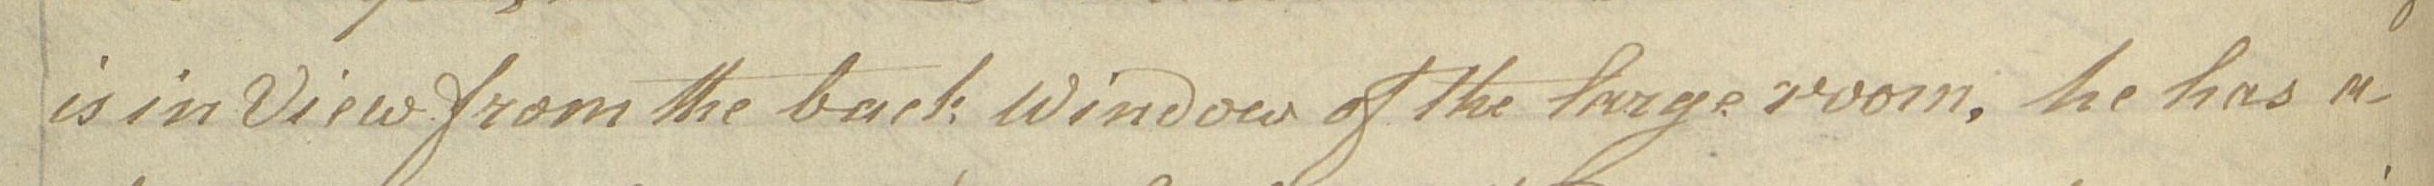is in View from the back window of the large room, he has a
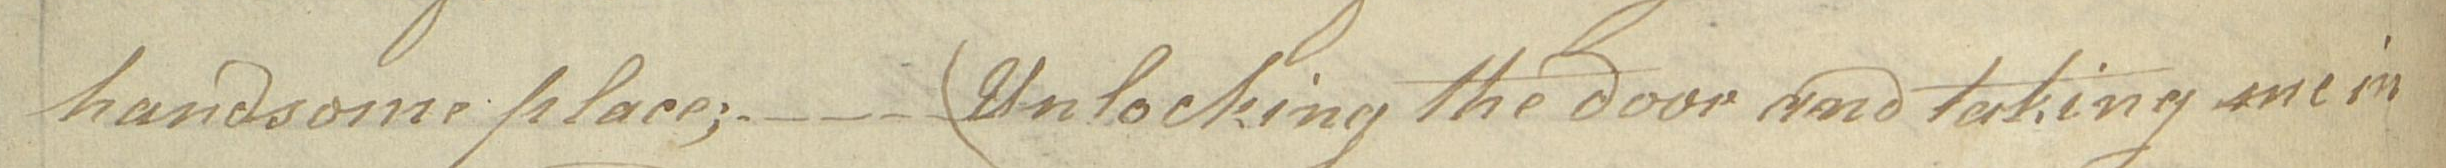handsome place; (Unlocking the door and taking me in
